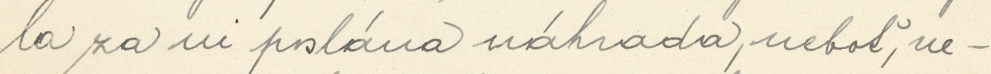la za ni poslána náhrada, neboť, ne-
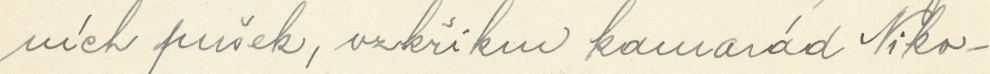ních pušek, vzkřikne kamarád Niko-
